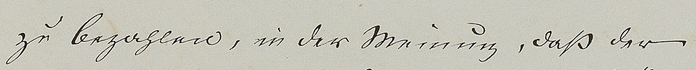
zu bezahlen, in der Meinung, daß der
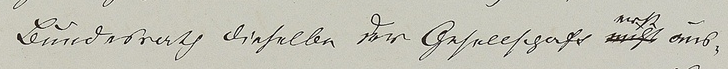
Bundesrath dieselbe der Gesellschaft nichterst aus-
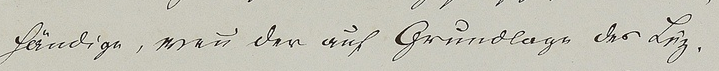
händige, wenn der auf Grundlage des Luz.
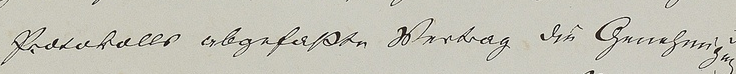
Protokolls abgefaßte Vertrag die Genehmigung
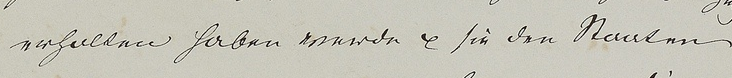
erhalten haben werde & sie den Staaten
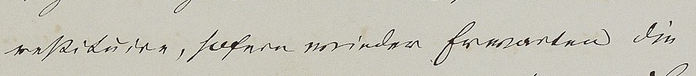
restituire, sofern wieder Erwarten die
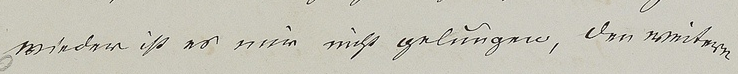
wieder ist es mir nicht gelungen, den weitern
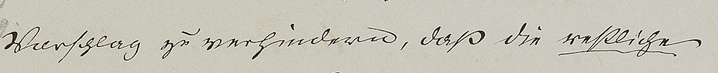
Vorschlag zu verhindern, daß die restliche
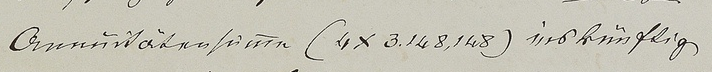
Annuitätensumme (4 x 3.148,148) inskünftig
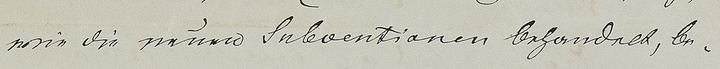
wie die neuen Subventionen behandelt, be-
